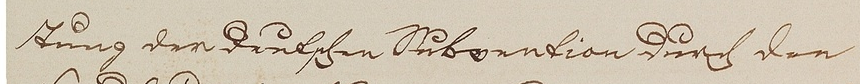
stung der deutschen Subvention durch den
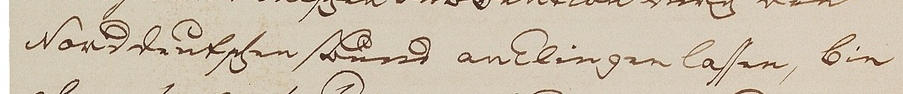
Norddeutschen Bund anklingen lassen, bin
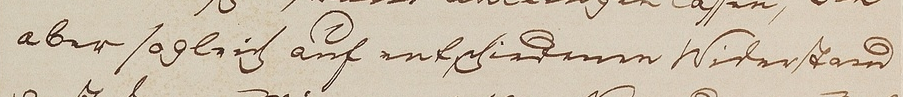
aber sogleich auf entschiedenen Widerstand
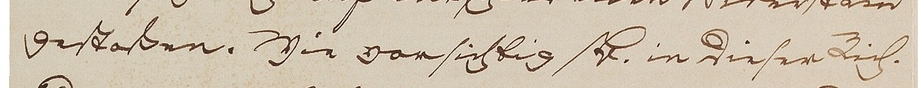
gestoßen. Wie vorsichtig B. in dieser Rich-
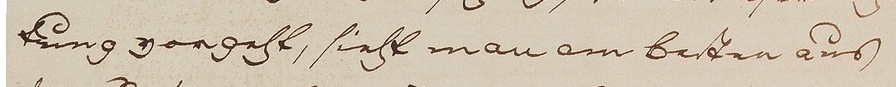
tung vorgeht, sieht man am besten aus
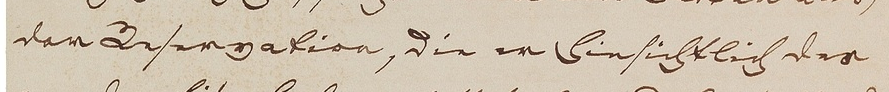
der Reservation, die er hinsichtlich des
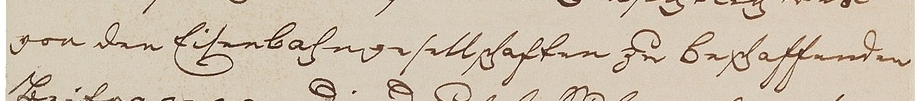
von den Eisenbahngesellschaften zu beschaffenden
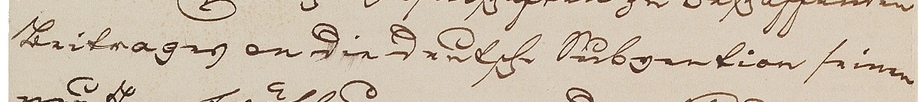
Beitrages an die deutsche Subvention seinen
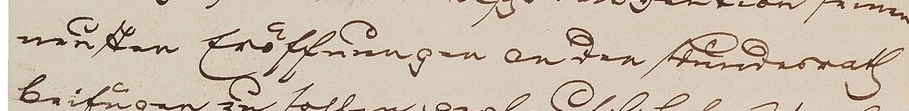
neusten Eröffnungen an den Bundesrath
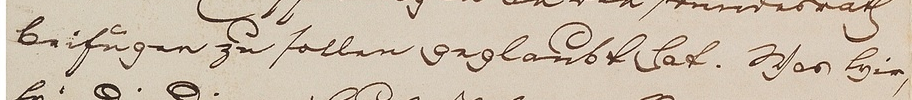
beifügen zu sollen geglaubt hat. Was wir,
